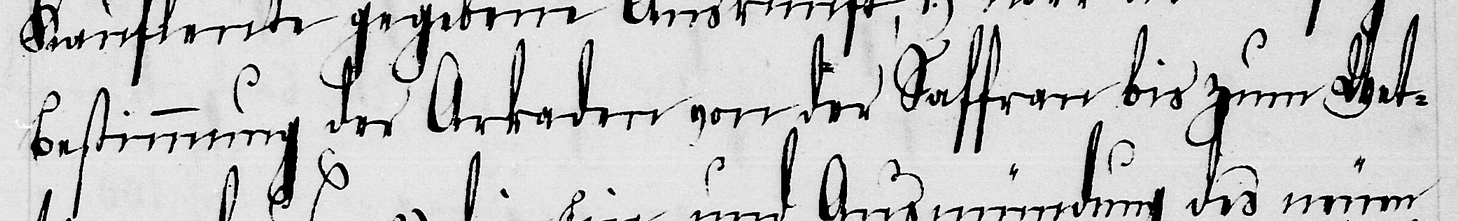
Bestimmung der Arkaden von der Saffran bis zum Wet¬
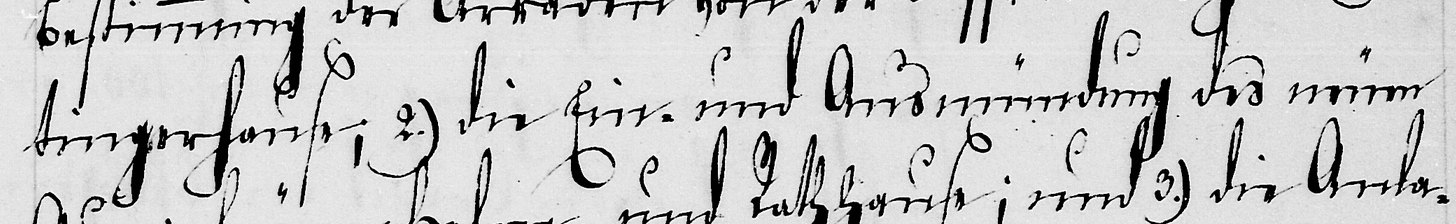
tingerhause; 2.) die Ein- und Ausmündung des neuen
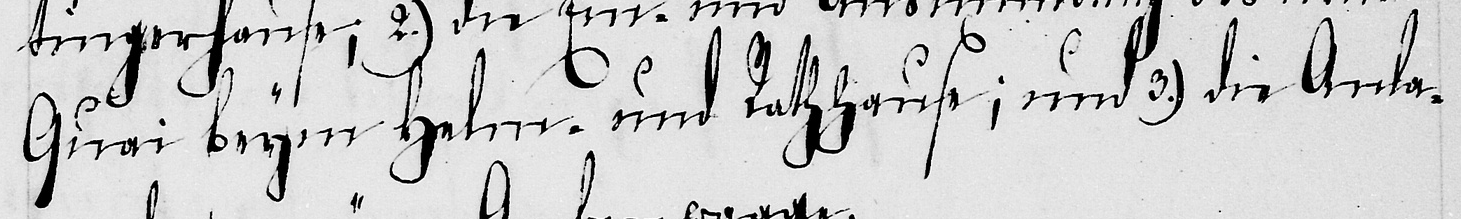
Quai beym Helm- und Rathhause; und 3.) die Anla¬
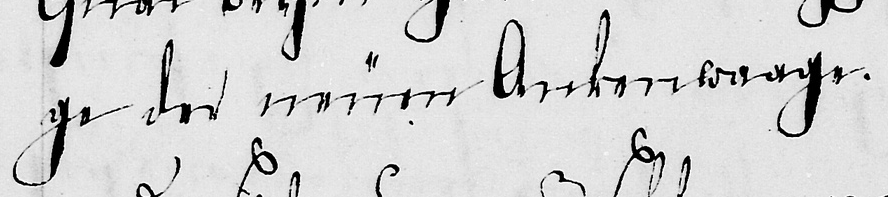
ge der neuen Ankenwaage.
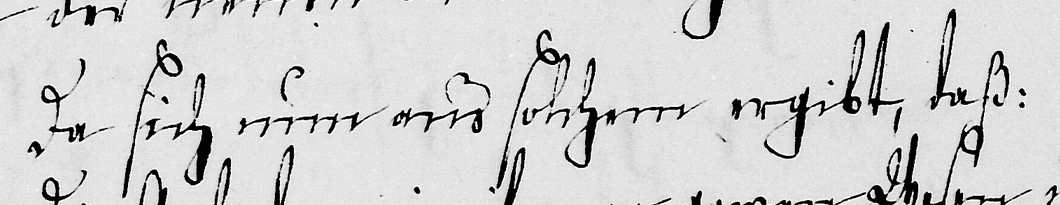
Da sich nun aus solchem ergibt, daß:
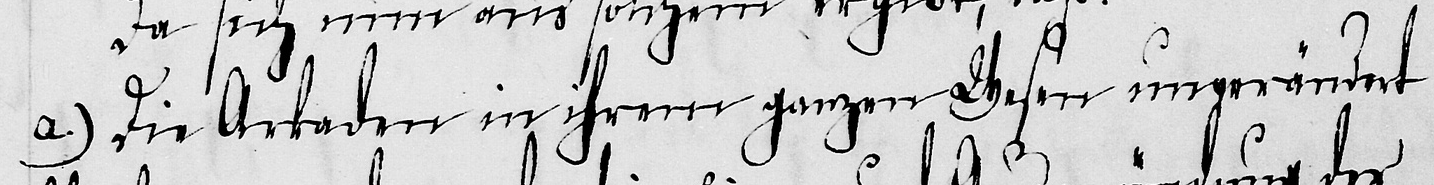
a.) Die Arkaden in ihrem ganzen Wesen unverändert
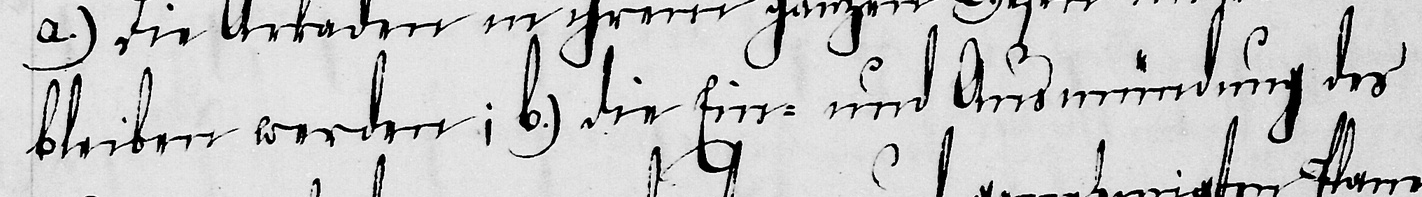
bleiben werden; b.) die Ein- und Ausmündung des
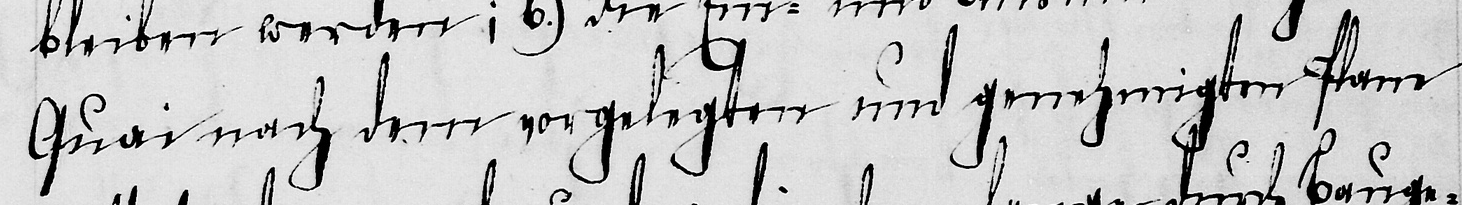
Quai nach dem vorgelegten und genehmigten Plane
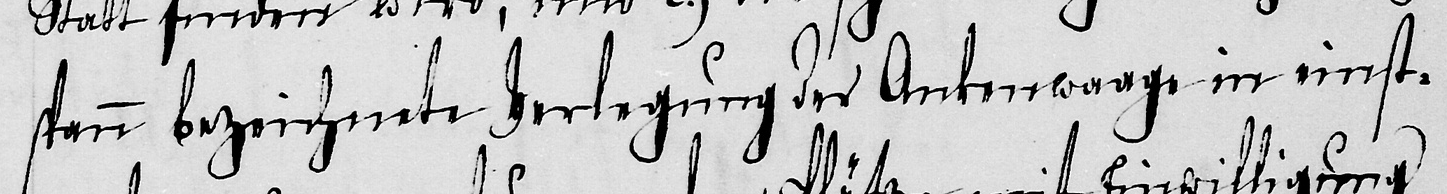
spann bezeichnete Verlegung der Ankenwaage in einst¬
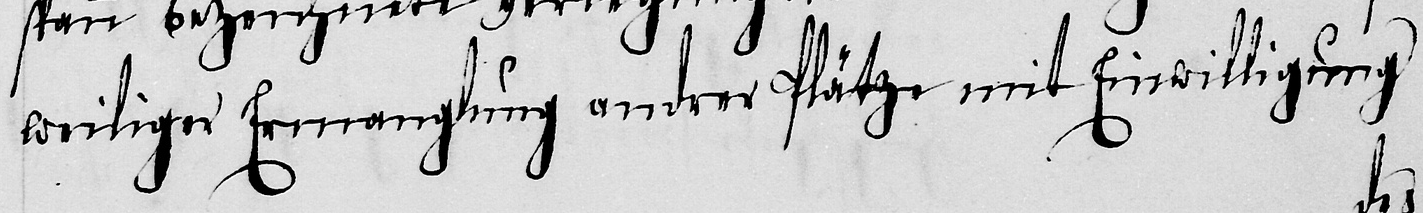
weiliger Ermanglung anderer Plätze mit Einwilligung
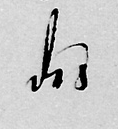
die
